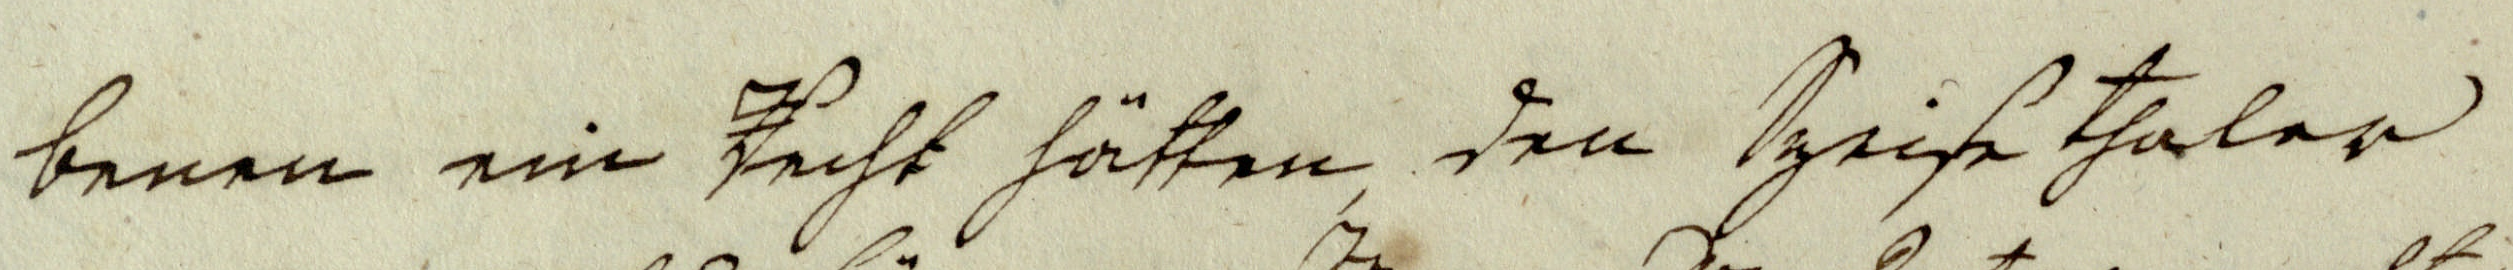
benen ein Recht hätten, den Speisethaler
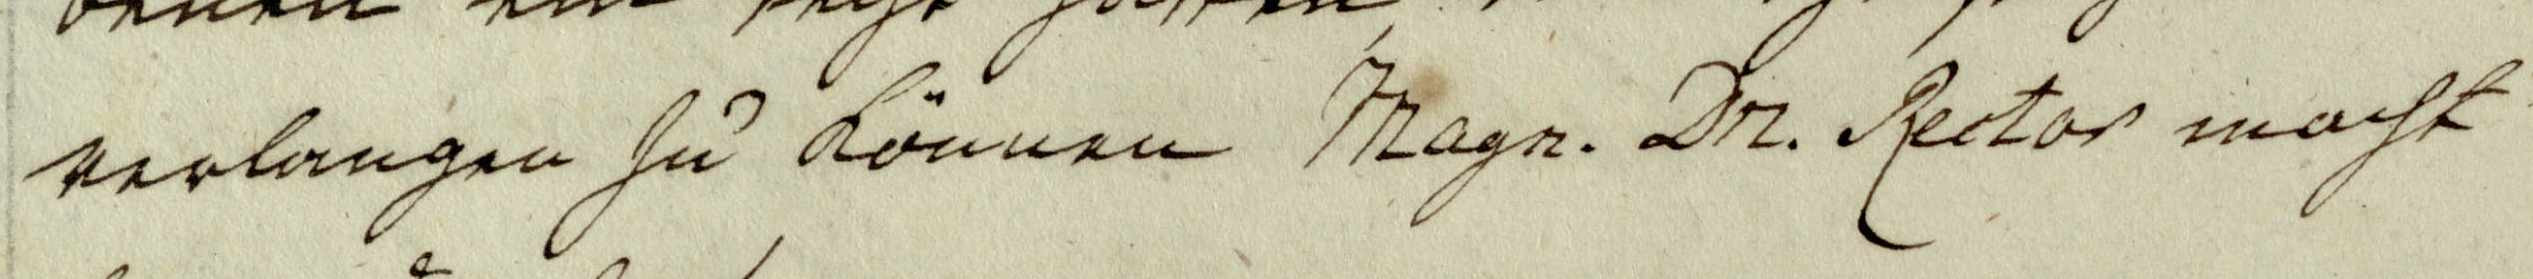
verlangen zu können. Magn. Dn. Rector macht
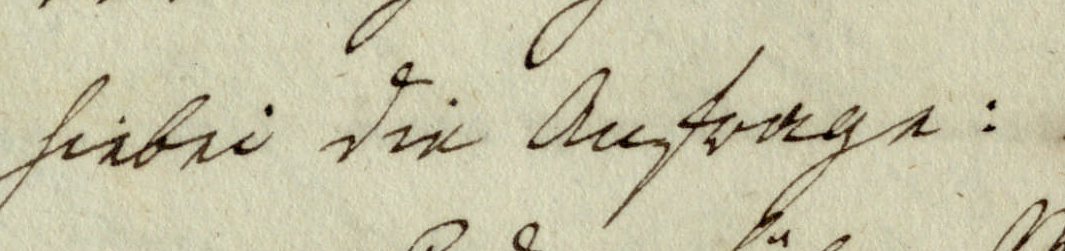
hiebei die Anfrage:
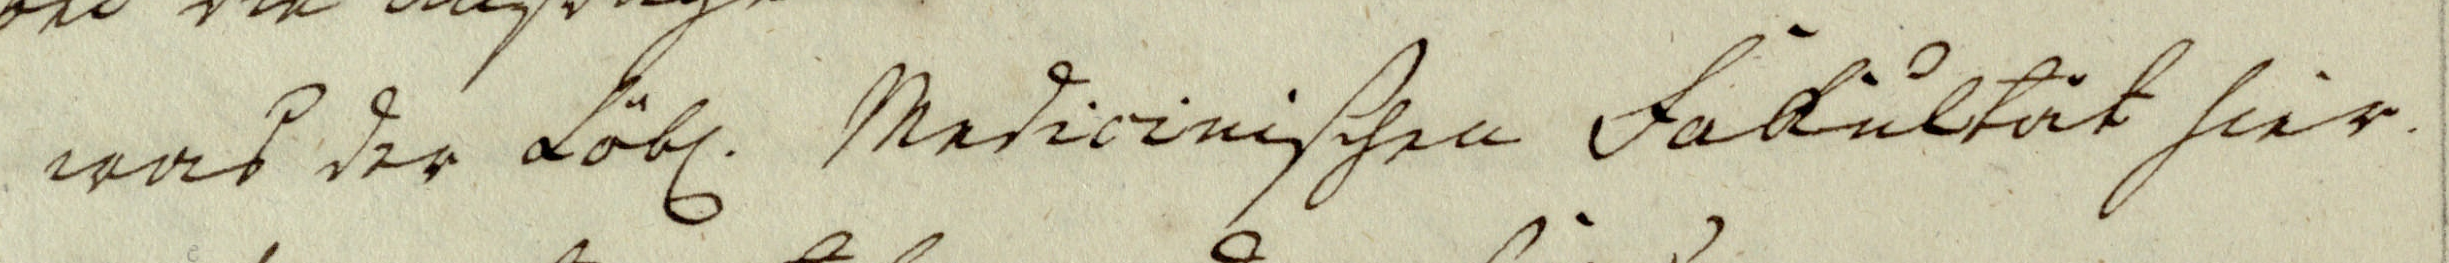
was der Löbl. Medicinischen Fakultät hier¬
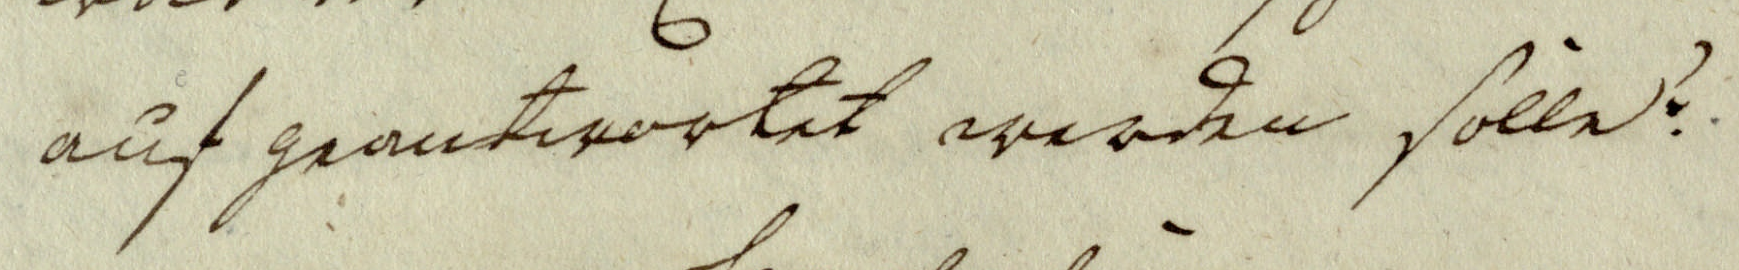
auf geantwortet werden solle?
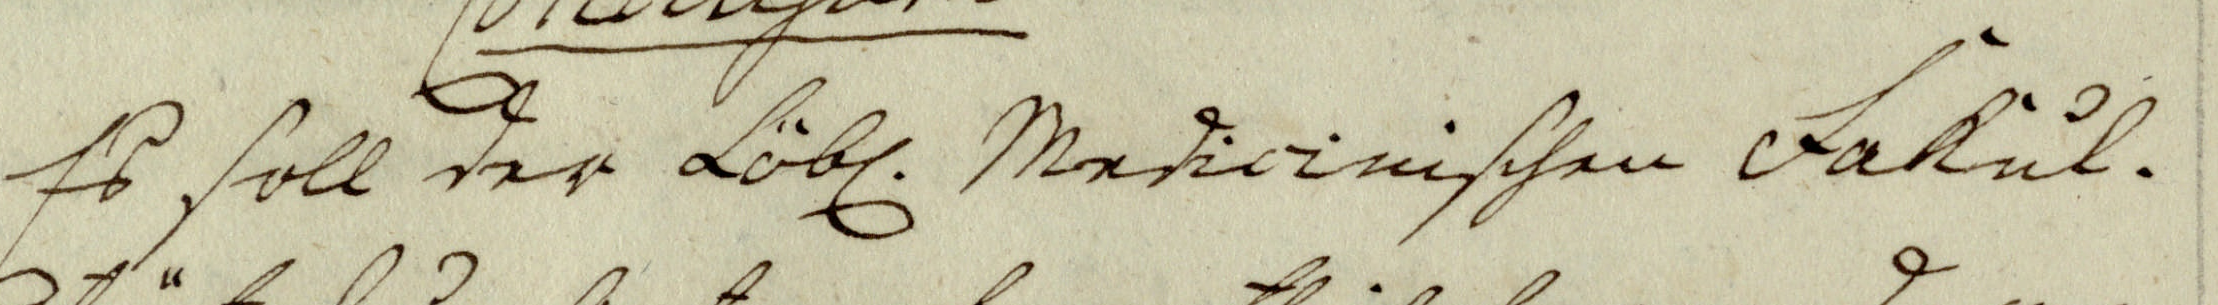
Es soll der Löbl. Medicinischen Fakul¬
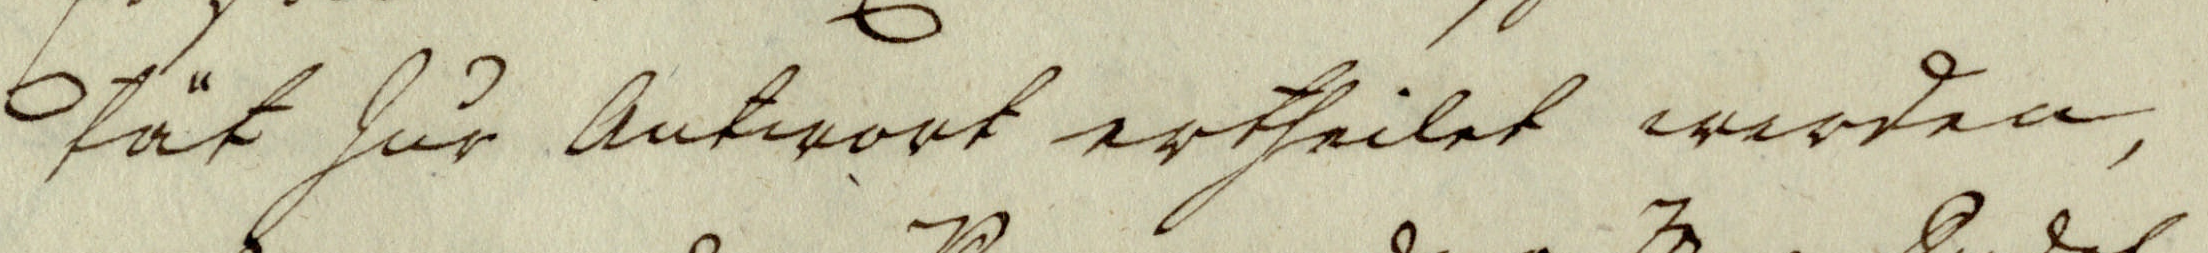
tät zur Antwort ertheilet werden,
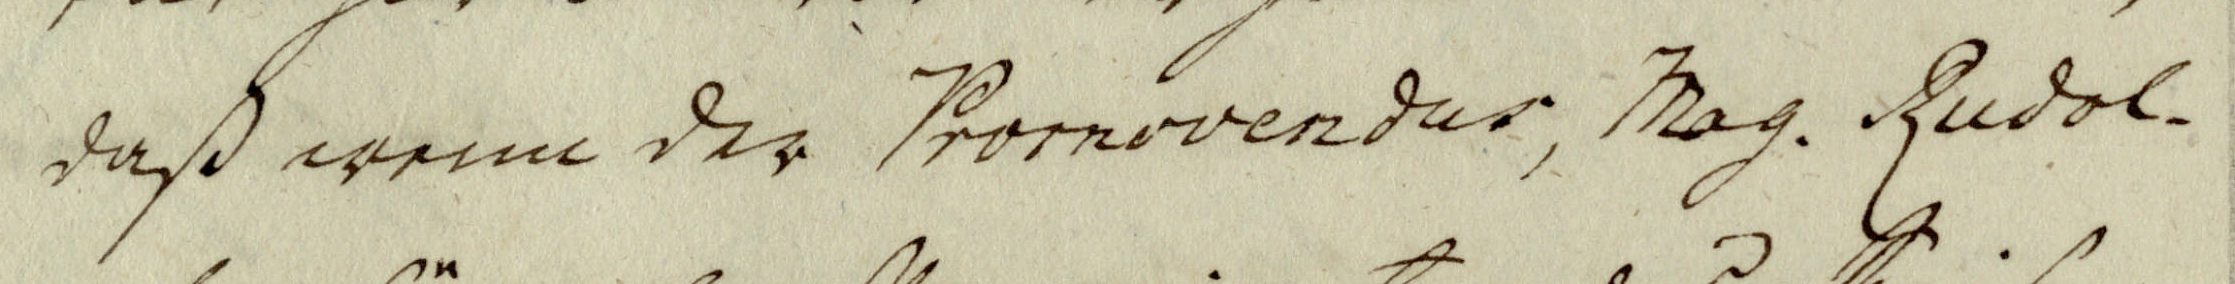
daß wenn der Promovendus, Mag. Rudol¬
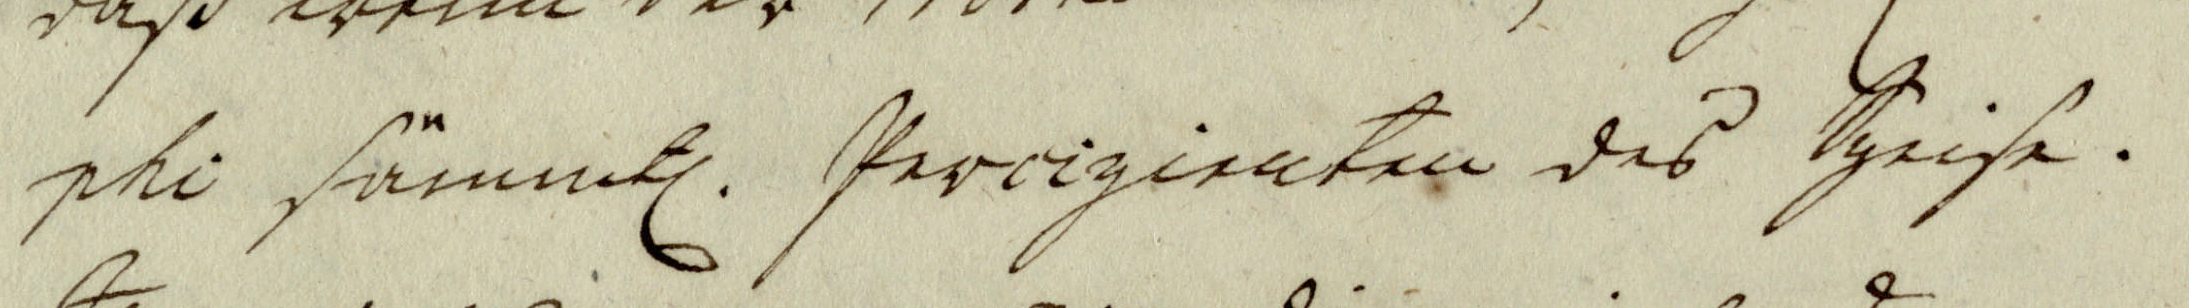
phi sämmtl. Percipienten des Speise
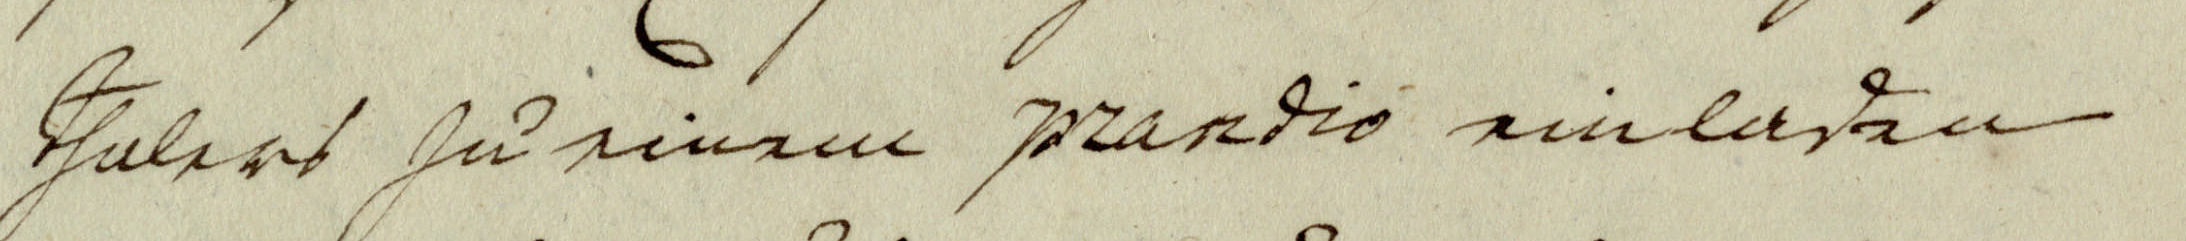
Thalers zu einem prandio einladen
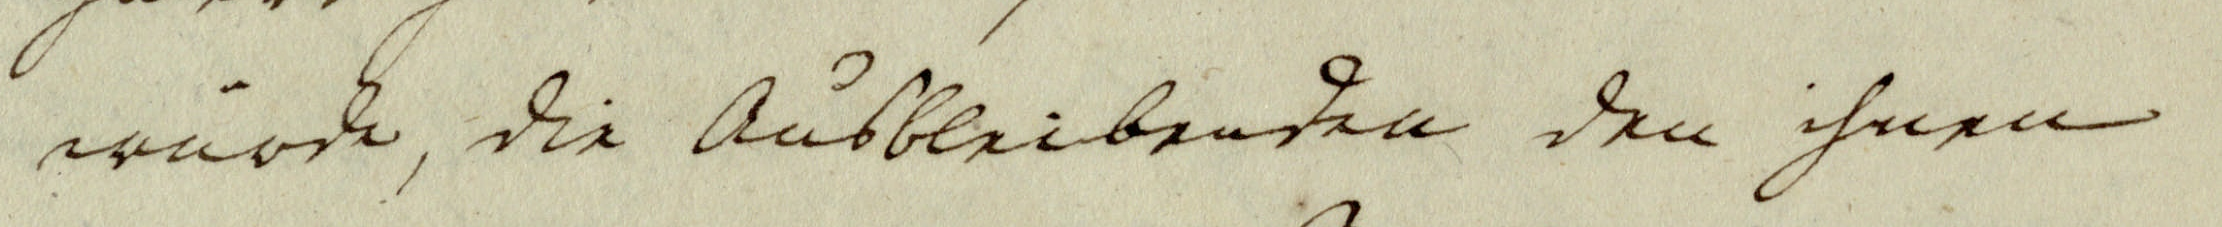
würde, die Ausbleibenden den ihnen
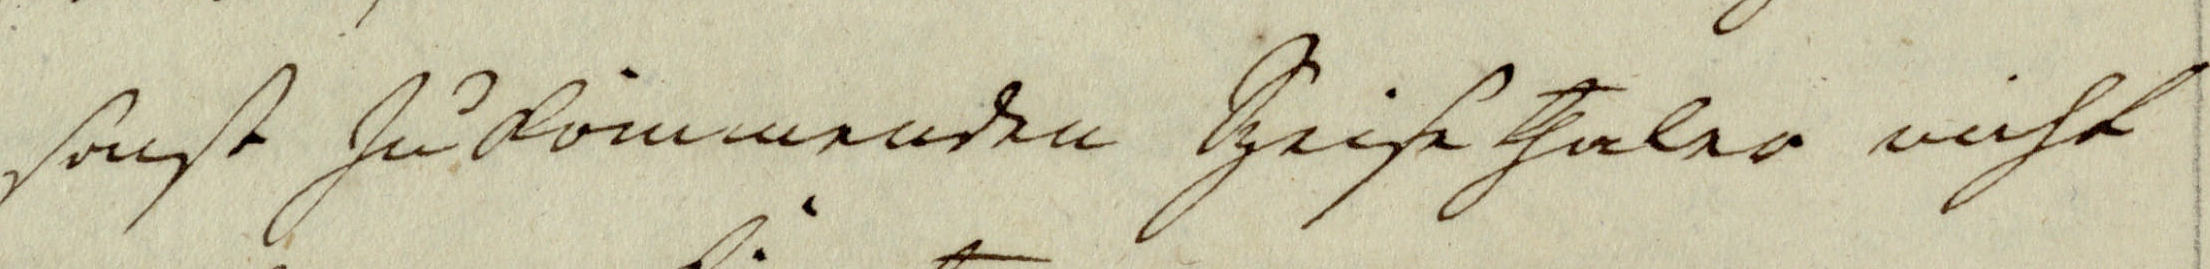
sonst zukommenden Speisethaler nicht
